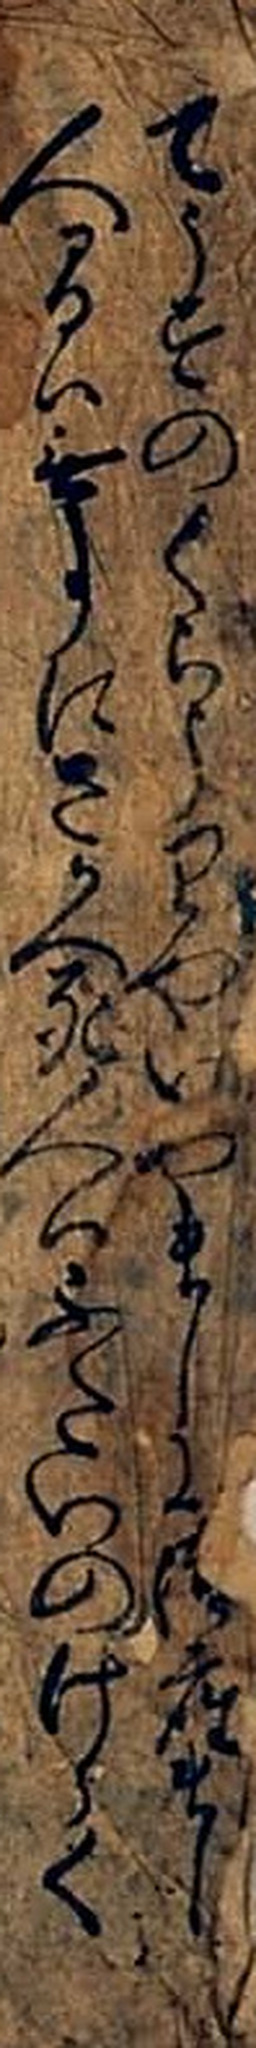人間は無事にさかへ死人はふたいのけらく
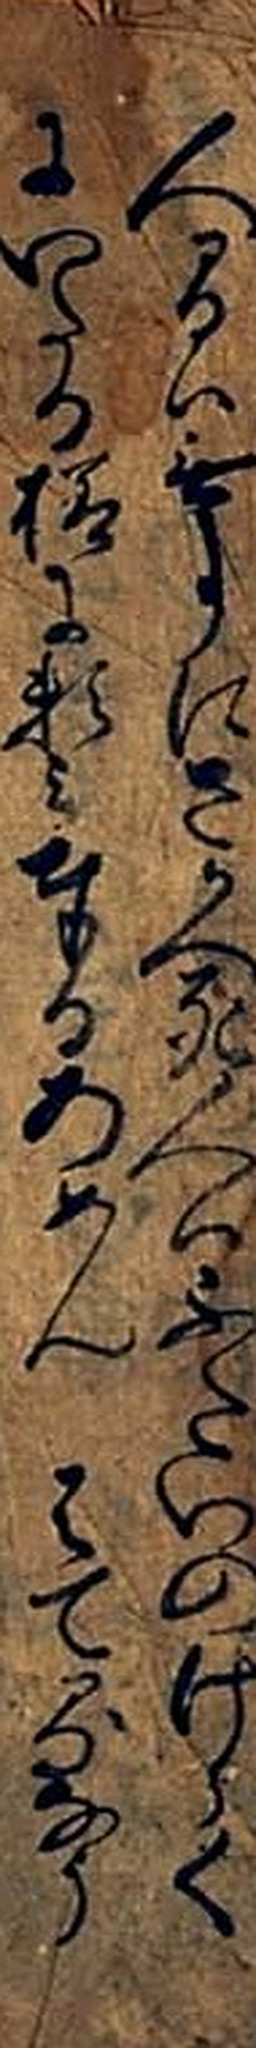にいたる様に頼み奉るあめんはてるなう
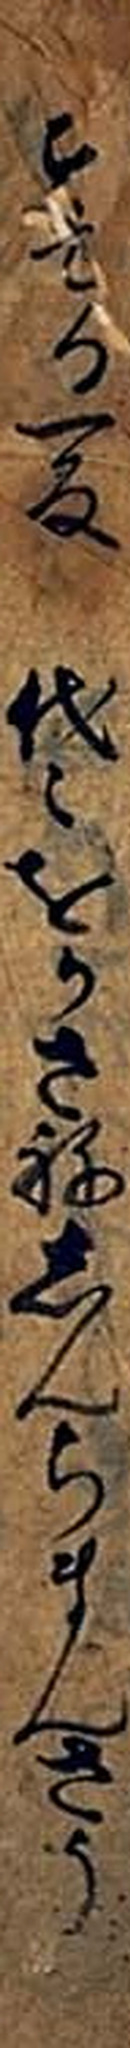すてる一反代々をかさねしんらまんさう
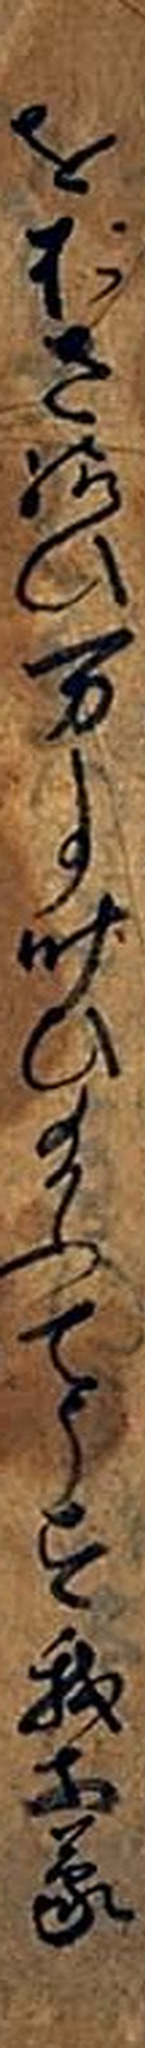をおさ給ひ万事叶ひ給ふてうす我等蒙
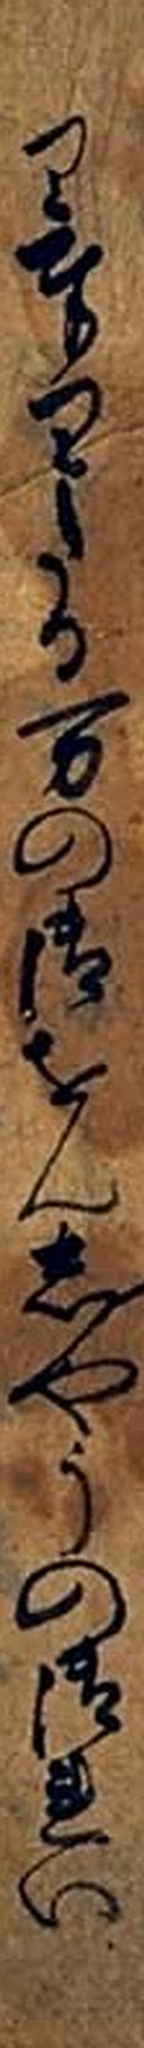り奉りたる万の御をんしやうの御れい
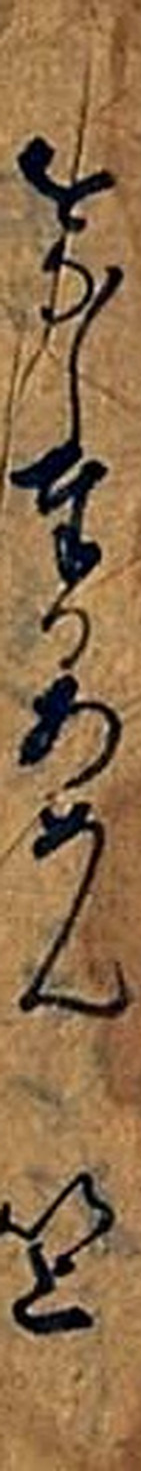をなし奉るあめん以上
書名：ドチリナ・キリシタン
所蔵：東京大学総合図書館 / General Library in the University of Tokyo
